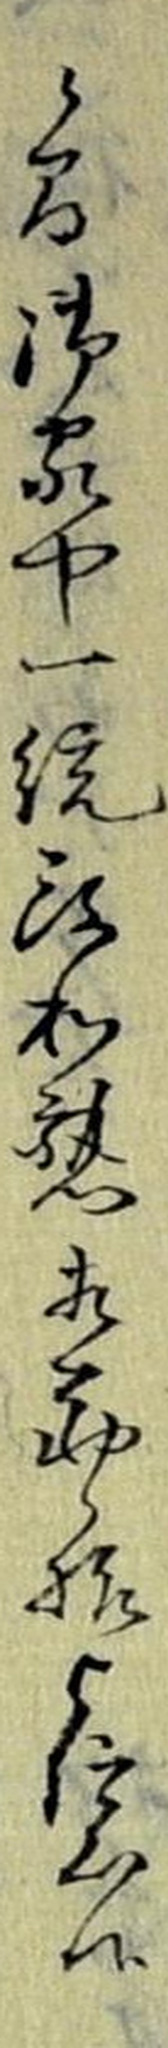候間御家中一統致和熟相勤候様被仰出候
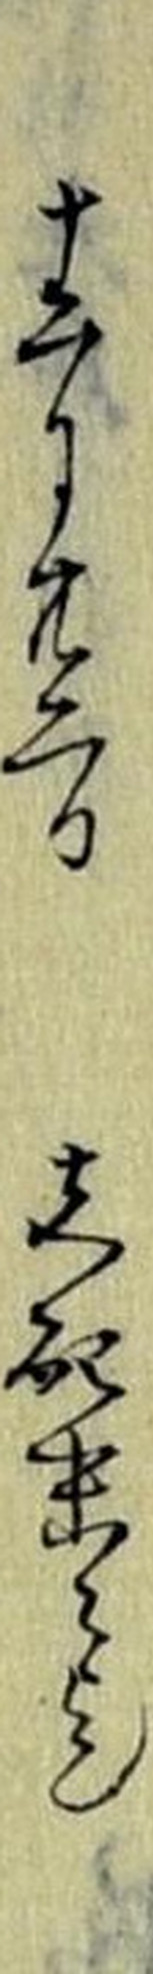十二月廿二日支配末々迄
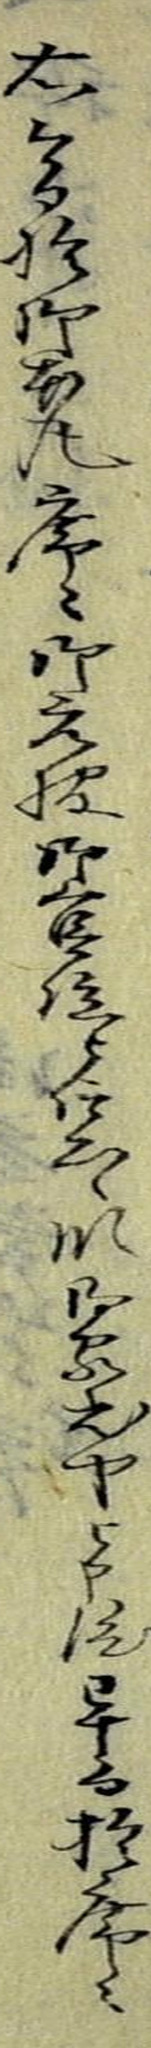右今日於御本丸席々御元服御官位被仰出候段御家老中被申渡畢而於席々
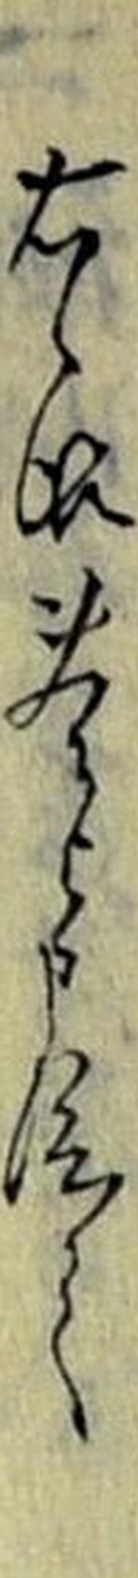右之趣夫々被申渡之
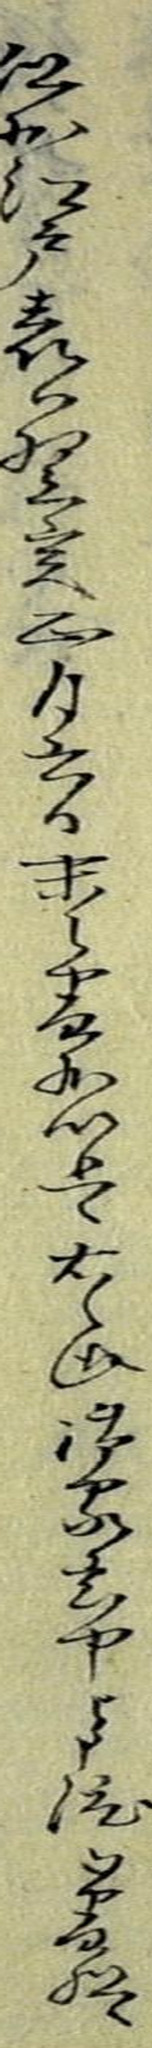但於江戸表は翌亥正月六日末之番外以上へ右之趣御家老中ゟ申渡御番組へ
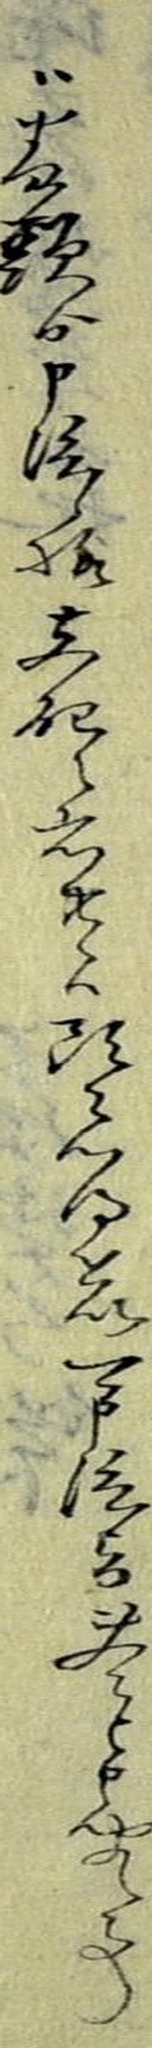は番頭ゟ申渡候様支配之者共へは頭に心得を以可申渡旨夫々被申聞候事
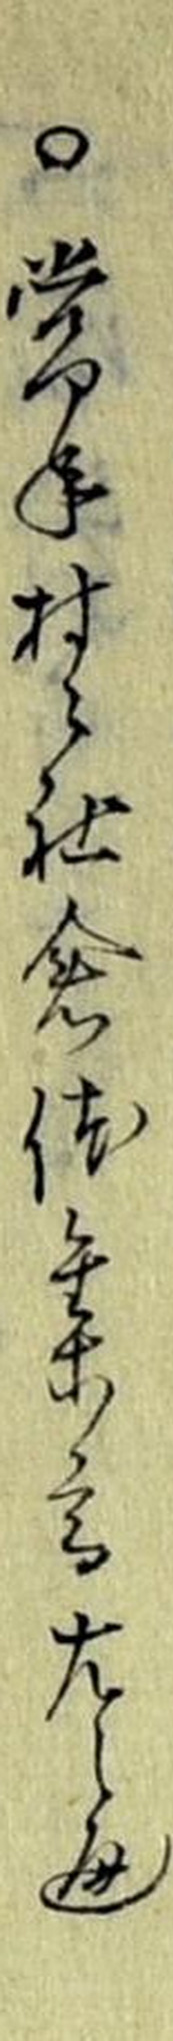〇当年村々社倉体集高左之通

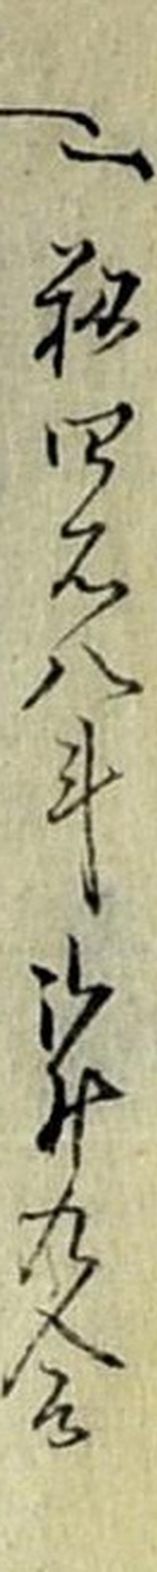一籾四石八斗弐升九合
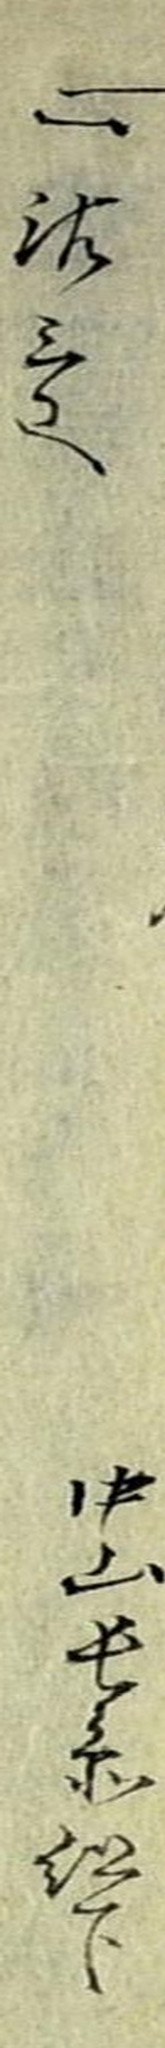一銀三匁中山長兵衛組下
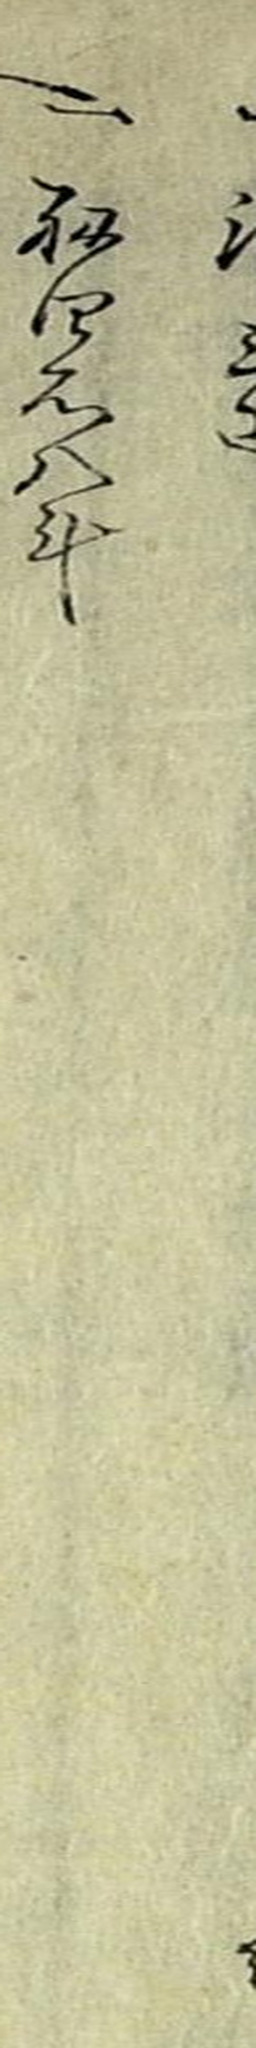一籾四石八斗
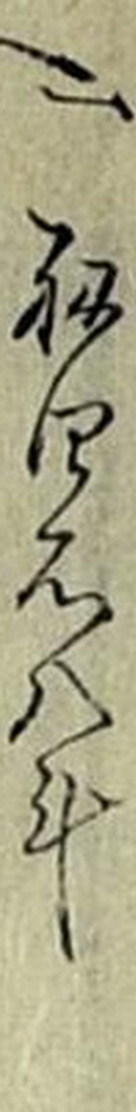一籾四石八斗
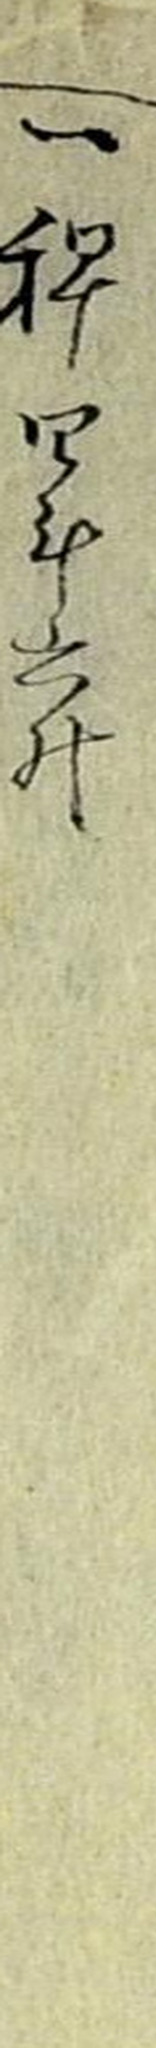一稗四斗六升
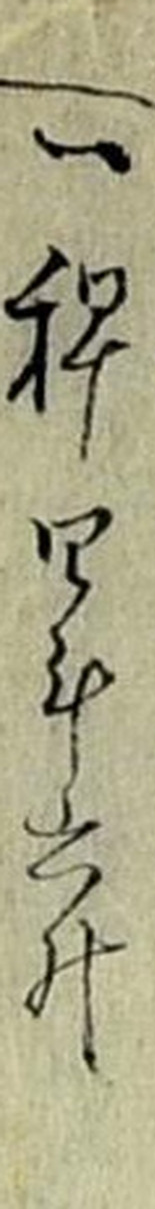一稗四斗六升
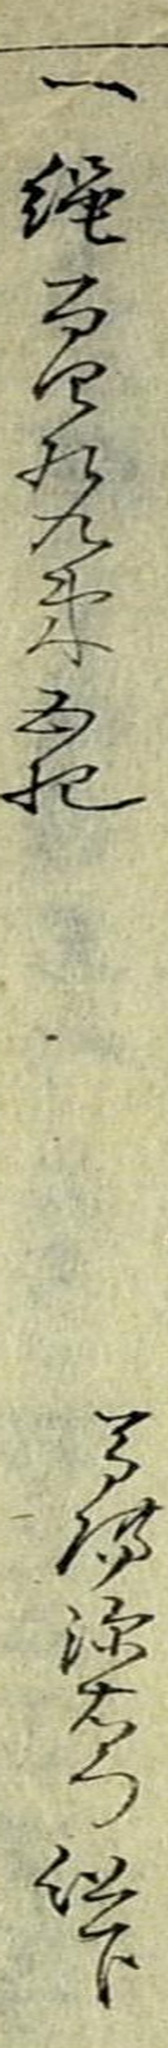一縄百四拾九束五把馬場源右衛門組下
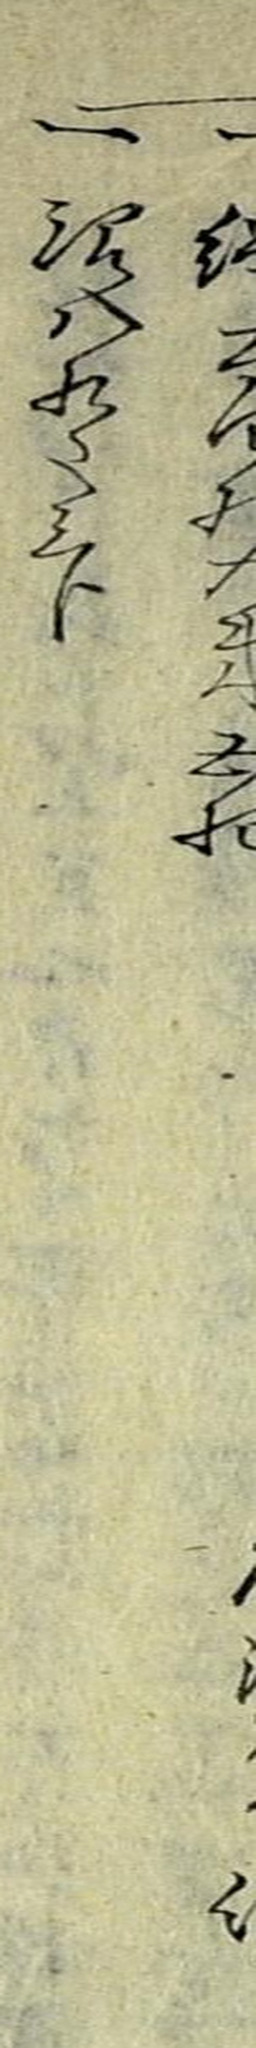一銀八拾匁三分
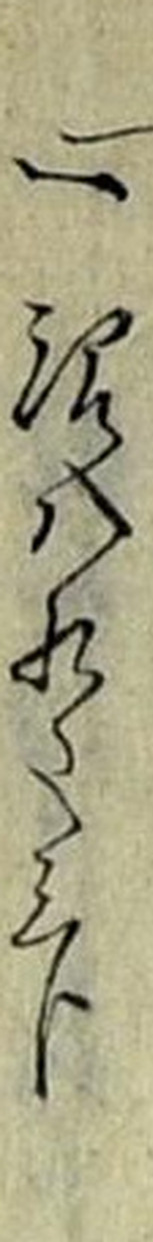一銀八拾匁三分
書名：命令之部 六
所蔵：福井県文書館 Fukui Prefectural Archives
